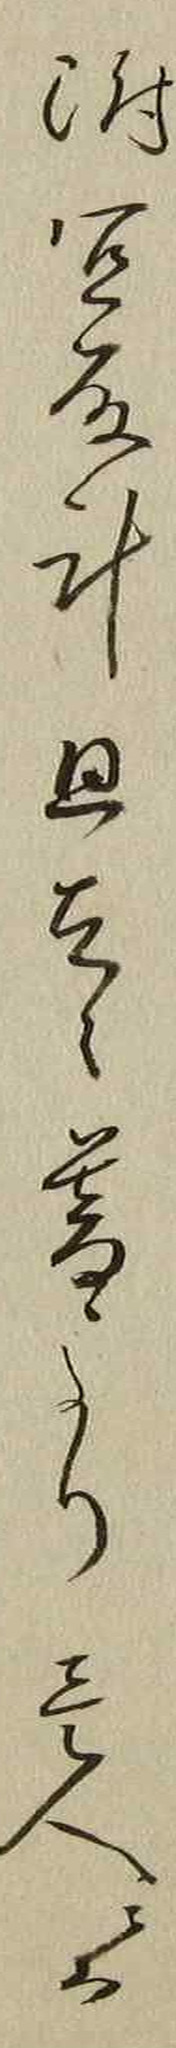附宜取計且去々暮より壱人ニ而
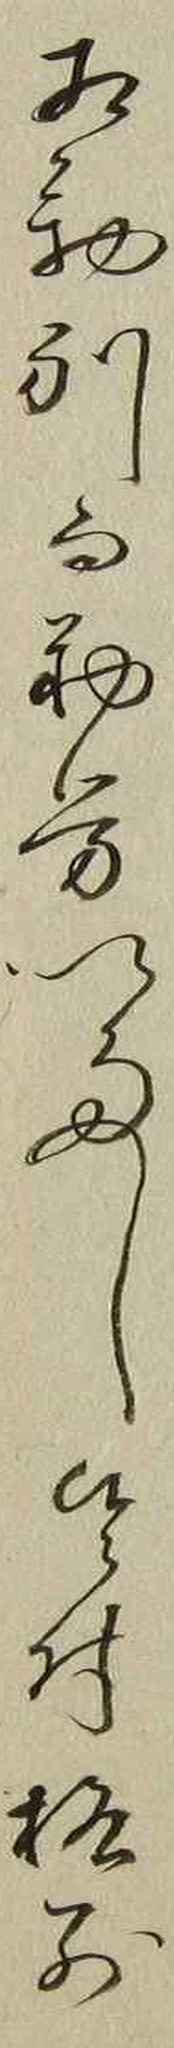相勤別而勤労いたし候ニ付格別
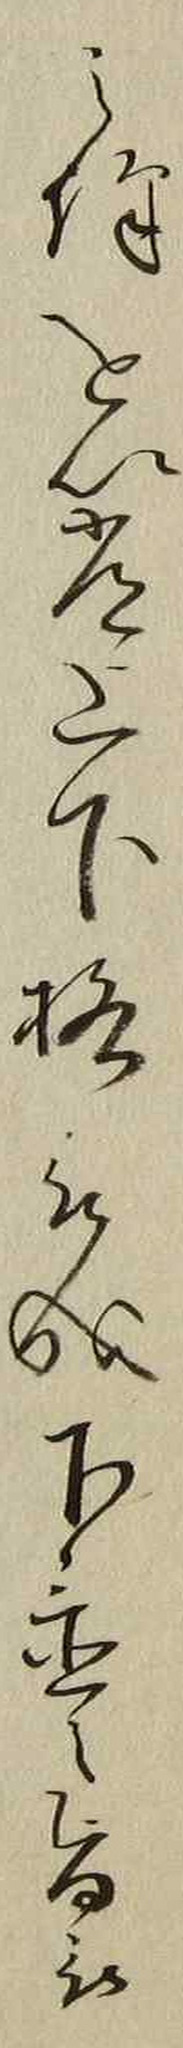之訳を以常上下格被成下置之旨被
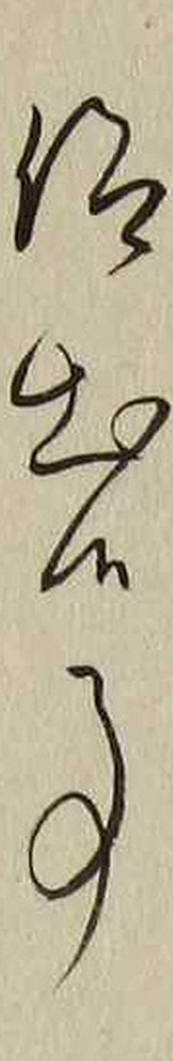仰出候事
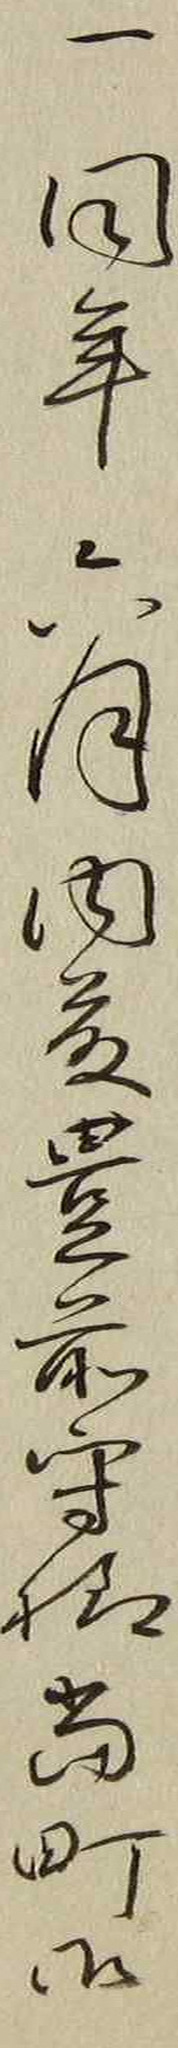一同年六月内藤豊前守様当町御
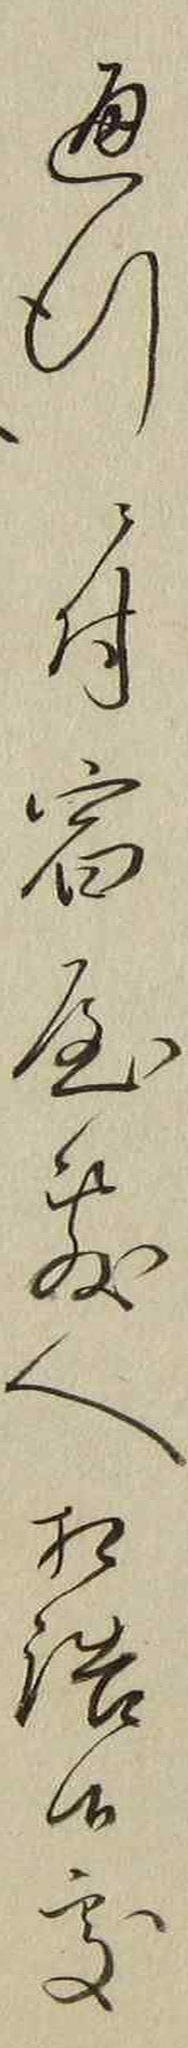通行ニ付宿屋敷へ相詰候処
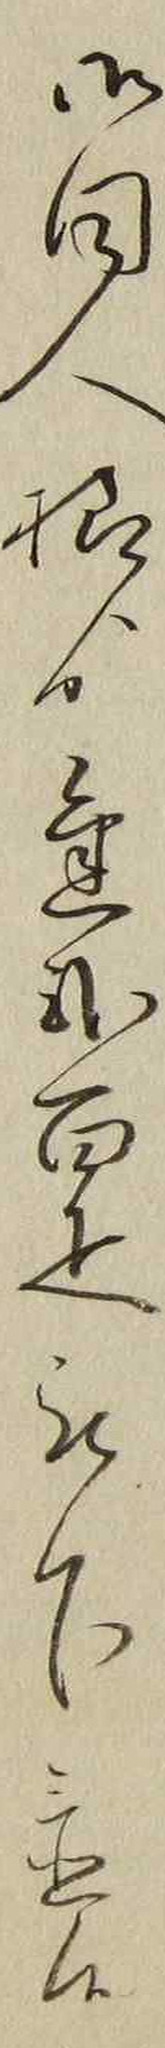御同人様ゟ金弐百疋被下置候

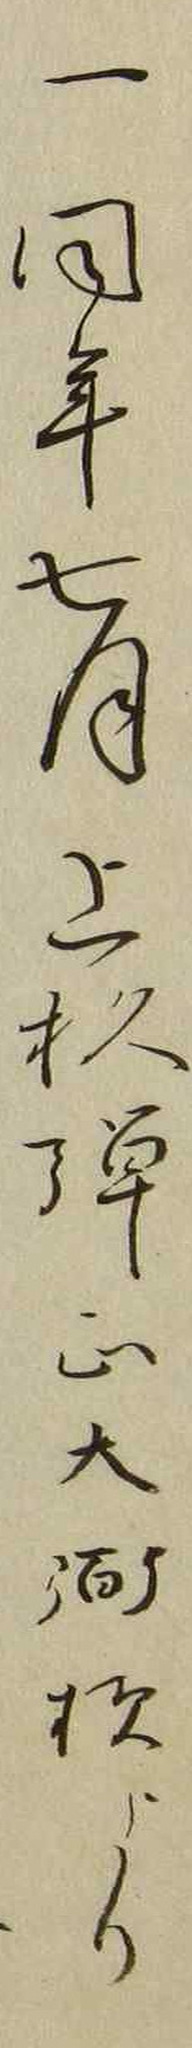一同年七月上杉弾正大弼様より
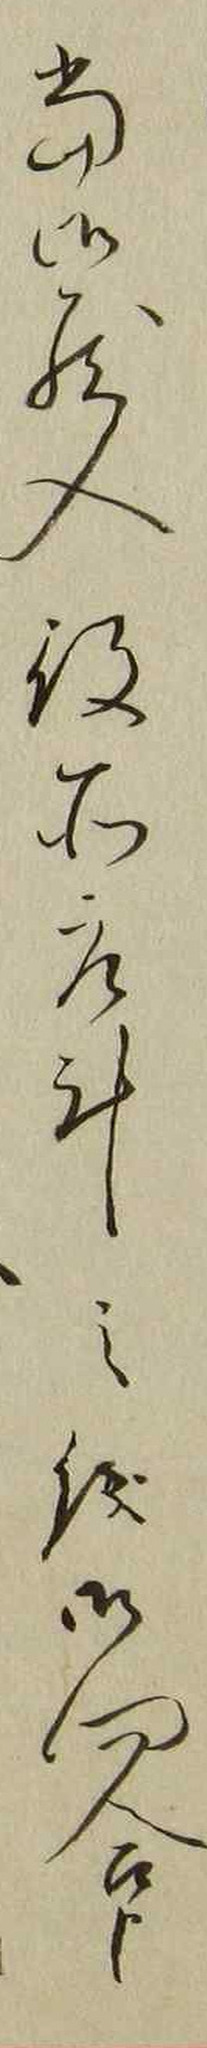当御蔵入役所取計之儀御問合申
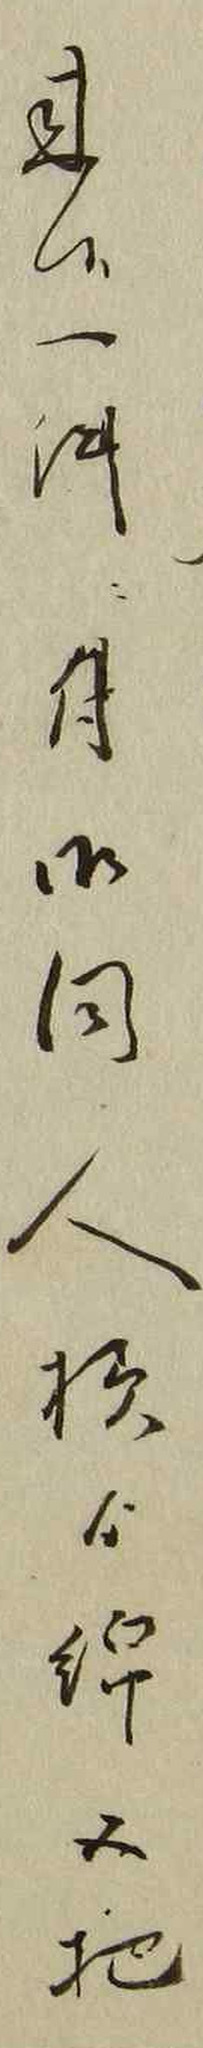来候一件ニ付御同人様ゟ綿五把
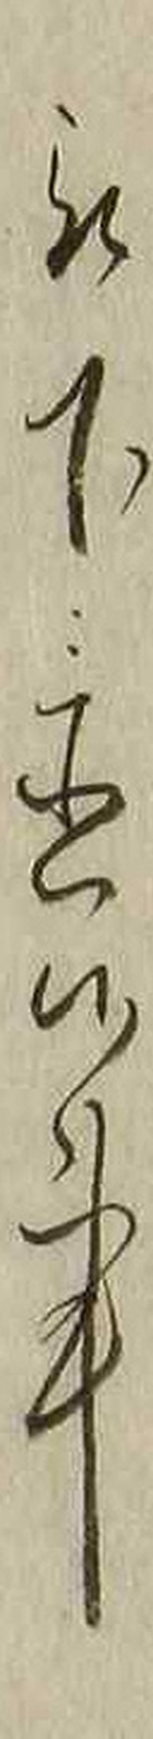被下置候事
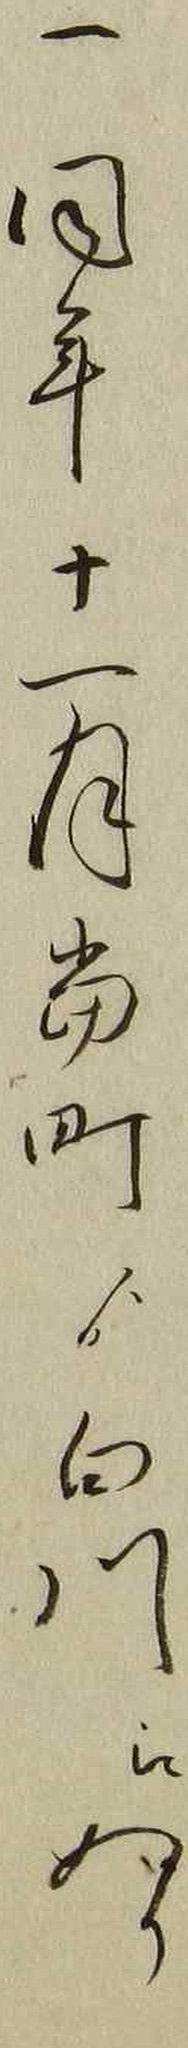一同年十一月当町ゟ白川江ぬり
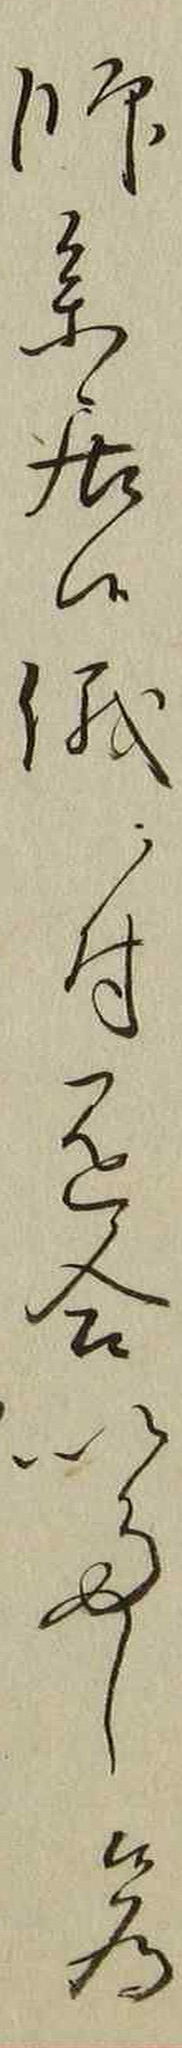師参居候儀ニ付懸合いたし候為
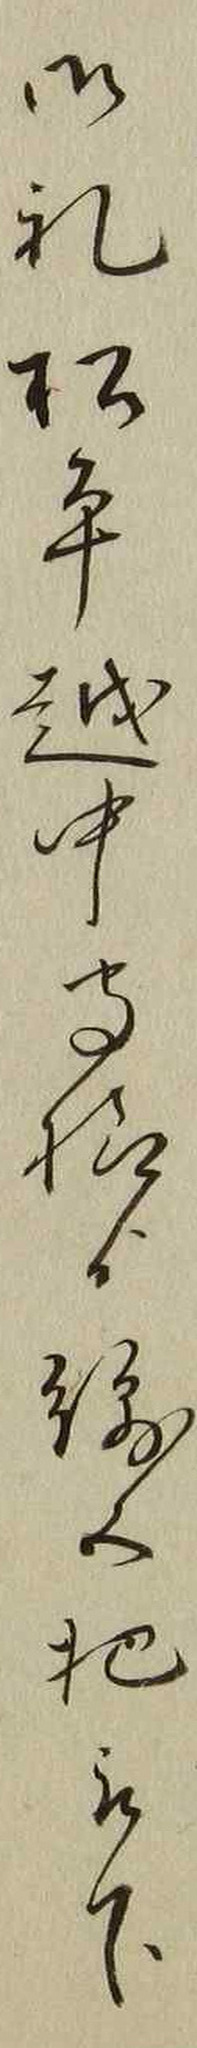御礼松平越中守様ゟ綿五把被下
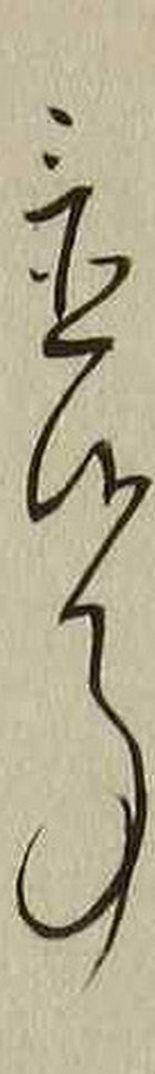置候事
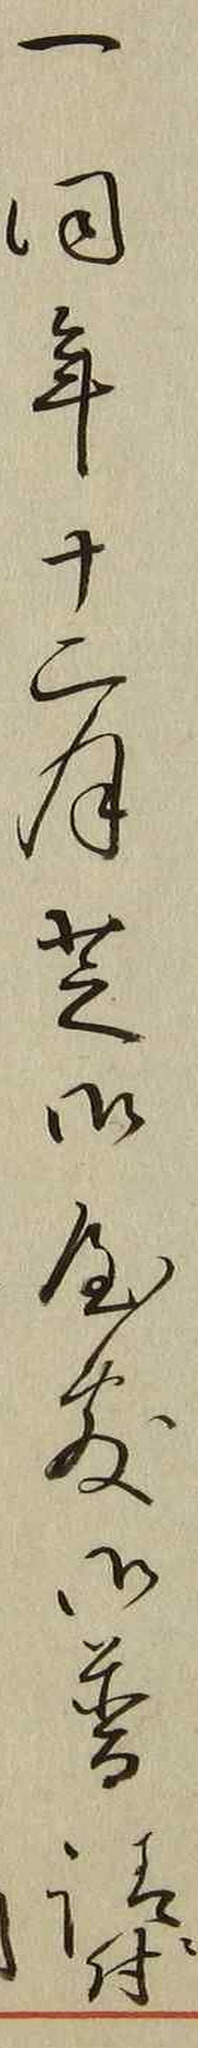一同年十二月芝御屋敷御普請ニ付
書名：諸士系譜　巻之3　い之部3
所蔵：会津若松市立会津図書館
